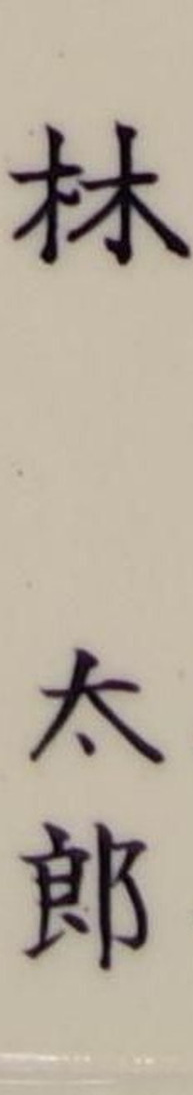林太郎
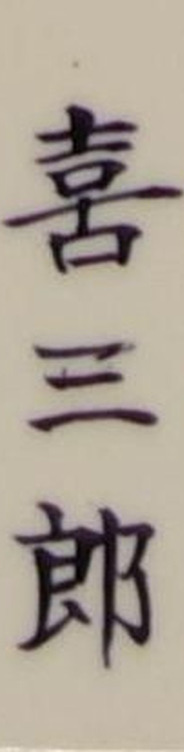喜三郎
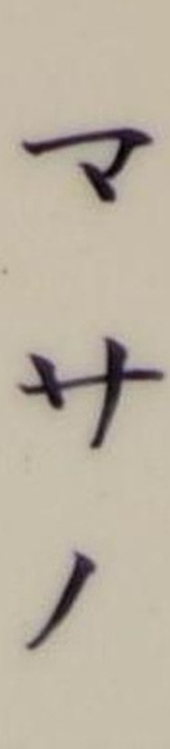マサノ
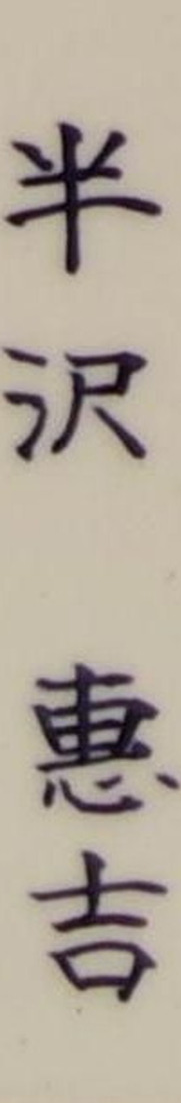半沢恵吉
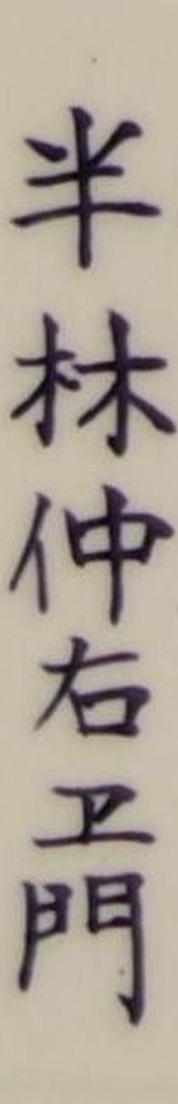半林仲右ヱ門

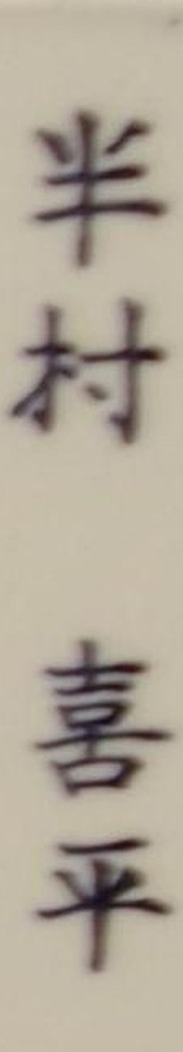半村喜平
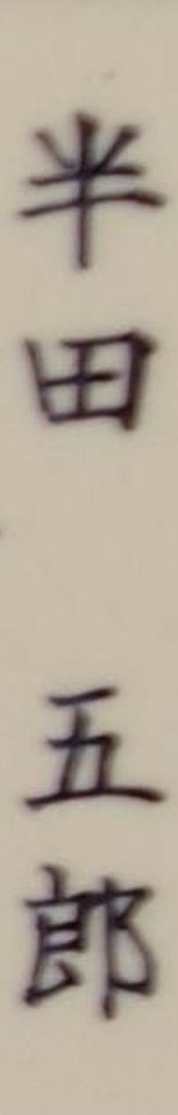半田五郎
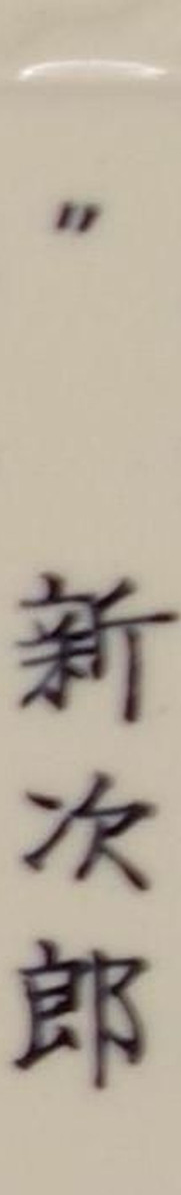新次郎
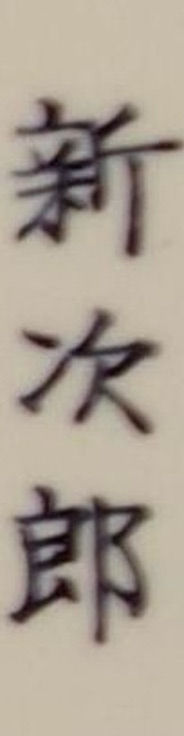新次郎
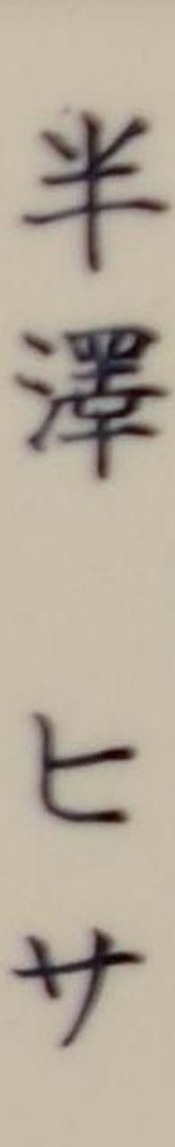半澤ヒサ
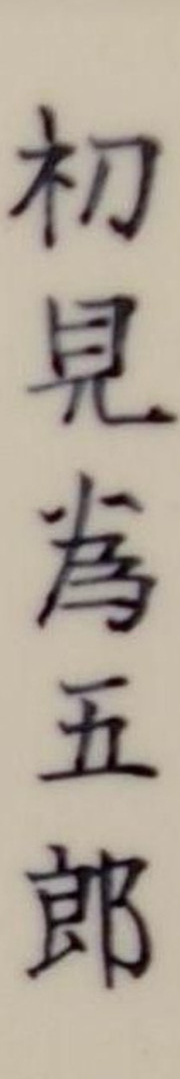初見為五郎
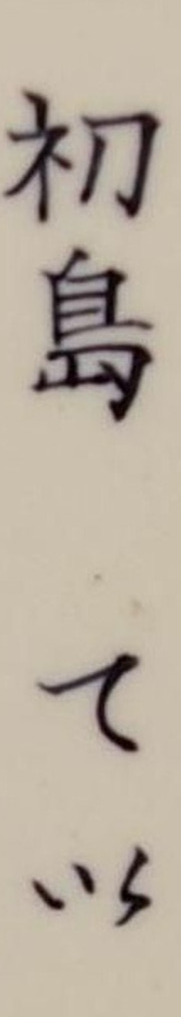初島てい
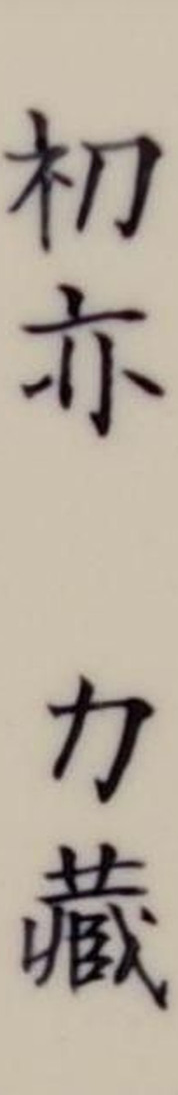初亦力蔵
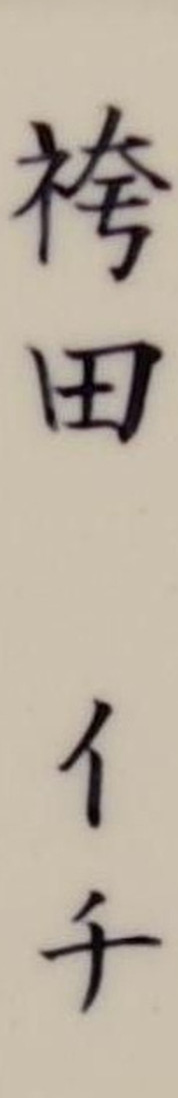袴田イチ
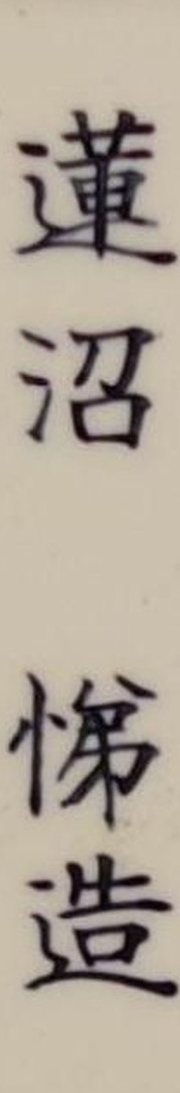蓮沼悌造

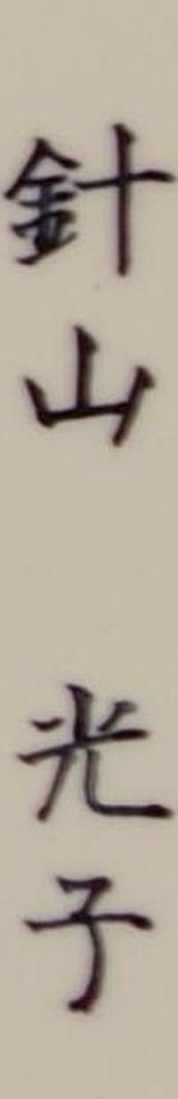針山光子
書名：M~S
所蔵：高野山金剛峯寺
